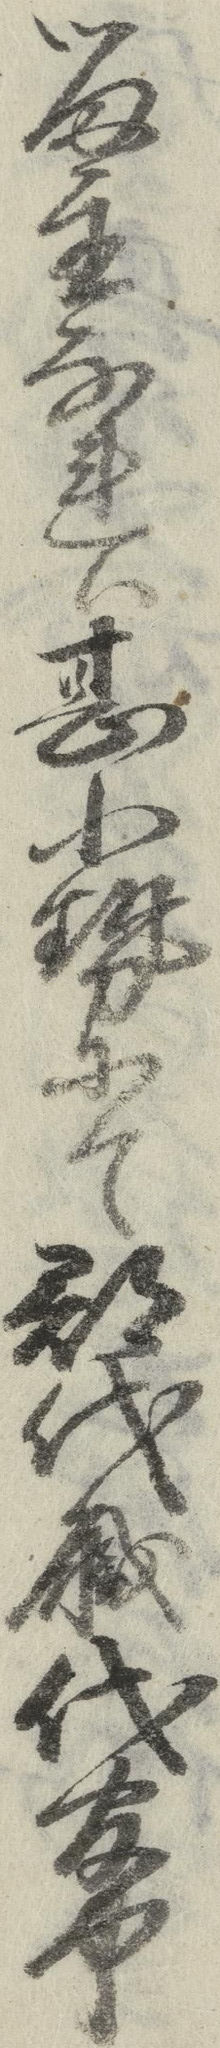留主なれは甚小勢にて郡代職代官中
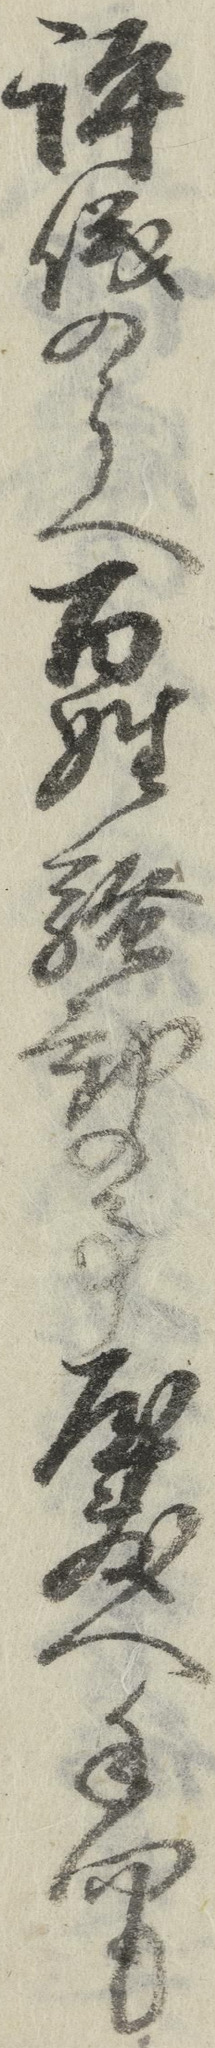評義のうへ百姓騒動の事家敷へ手向も
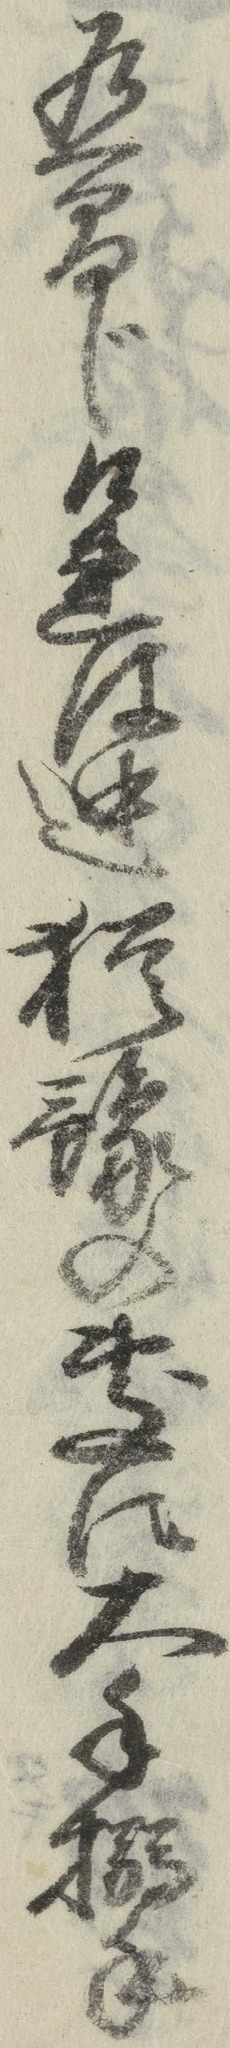有間じけれは迚於豫の処に大手搦手

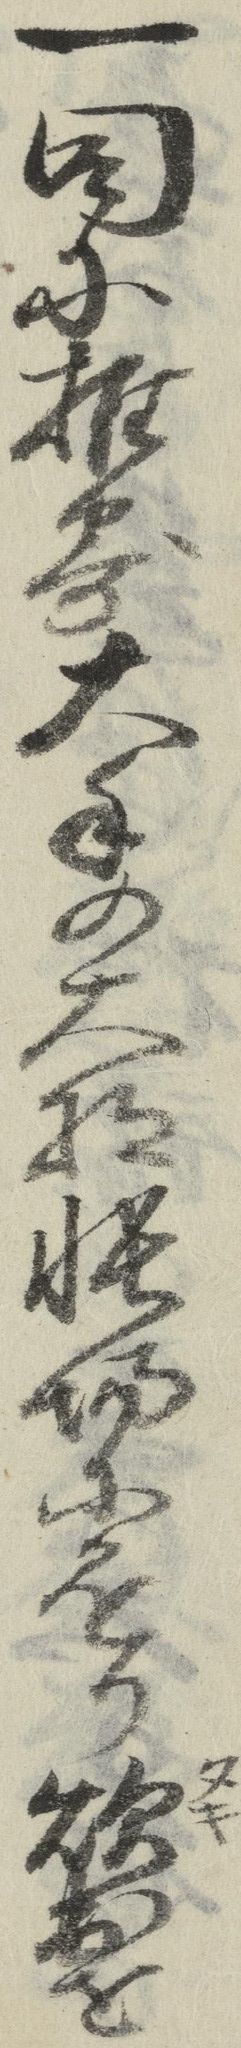一同に推寄大手の大将帳場に懸かり炊出を
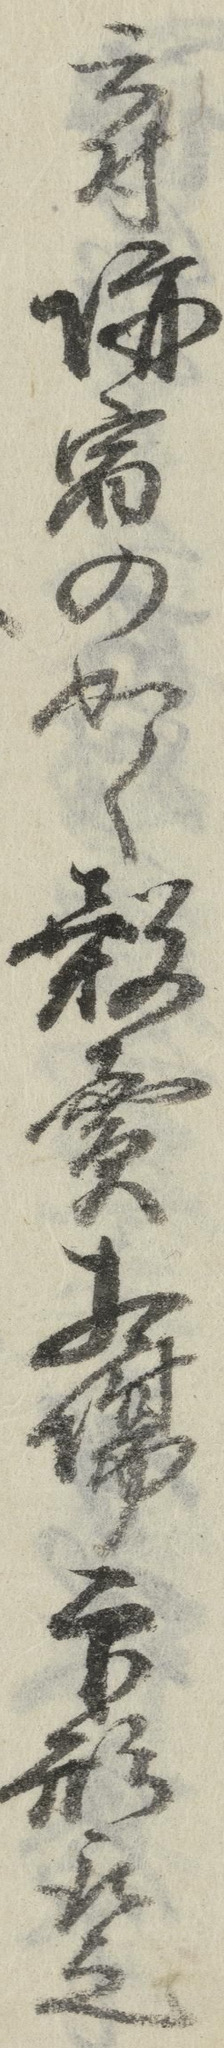云付跡宿の如く穀売相場印形取立
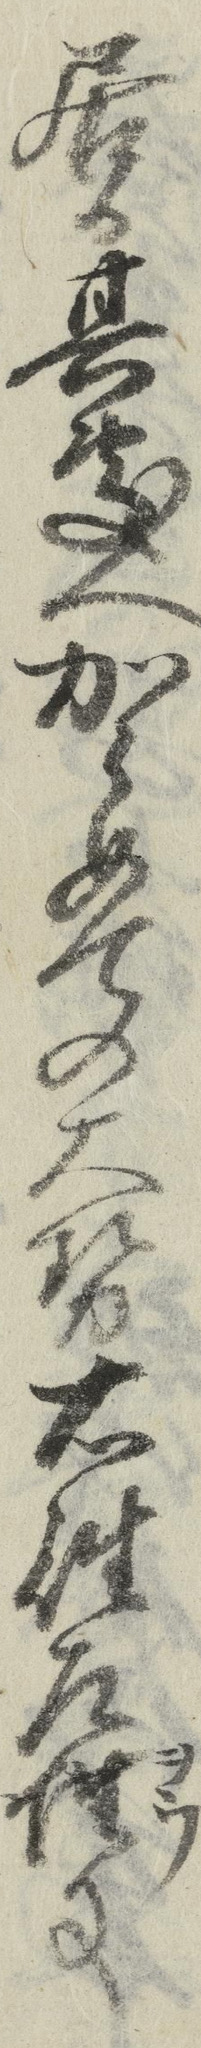居る其処へからめての大勢右往左往に
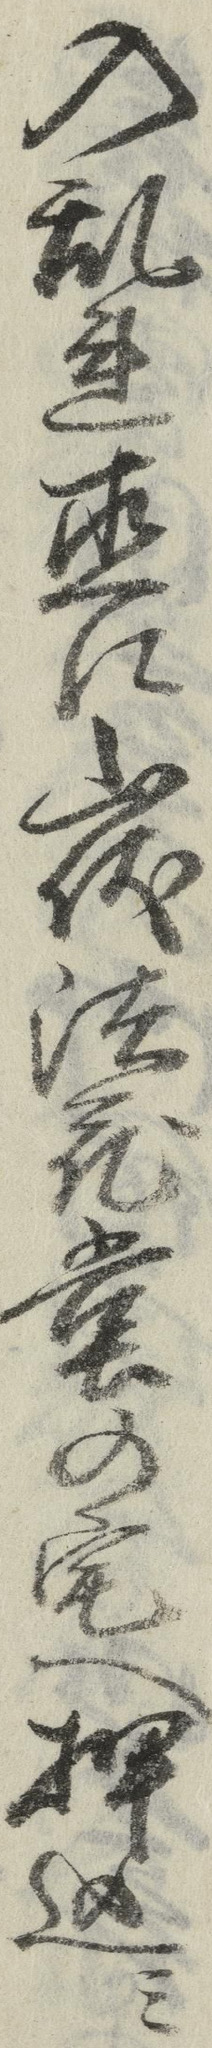入乱れ直に山伏法花堂の宅へ押込み
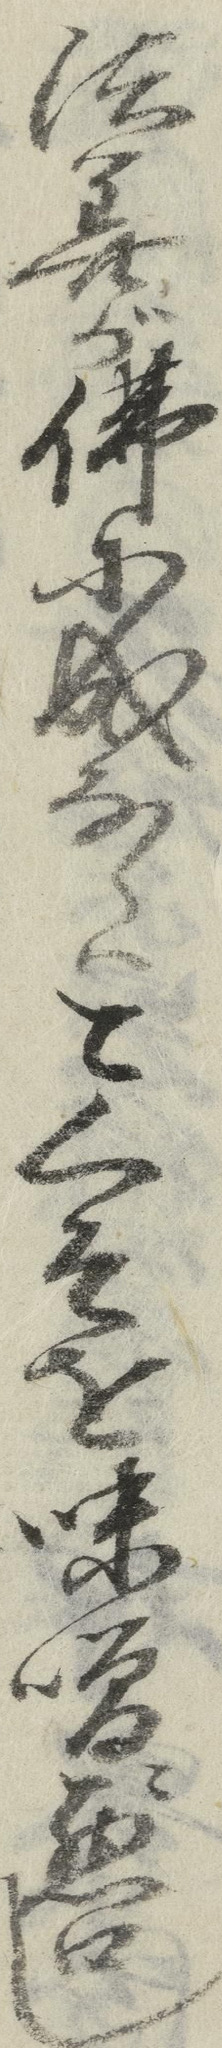法美が仏に成ならはとくそを味噌に悪口し
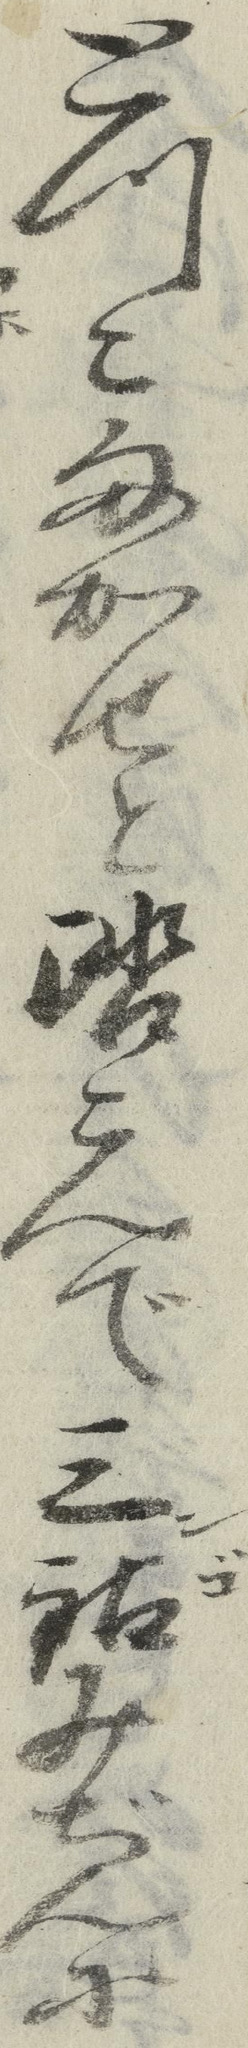とつこたかせと踏こんで三鈷みぢんに
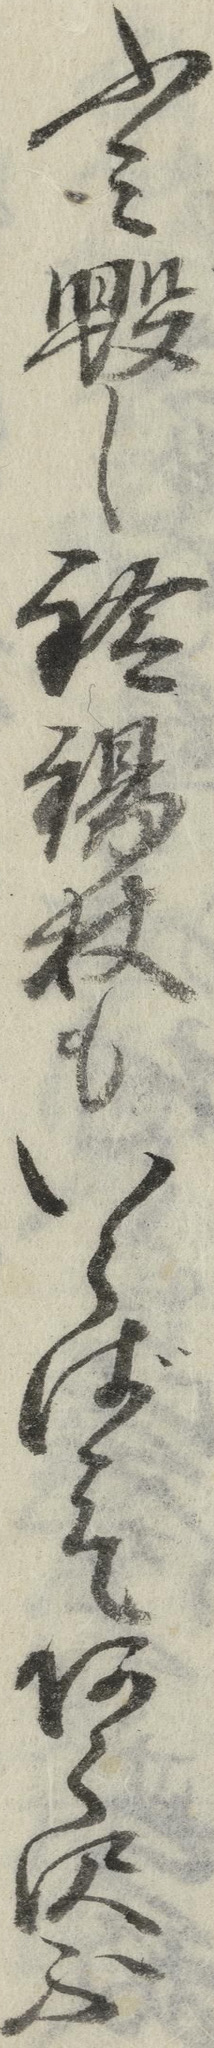ふみ毀し鈴錫杖もいらばとてあら沢ふ
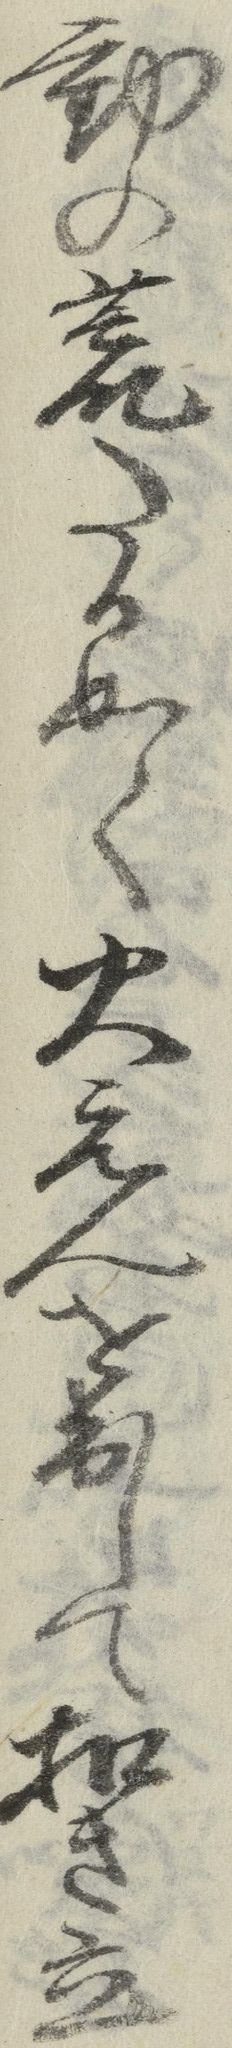動の荒たる如く火えんを出して扣き立
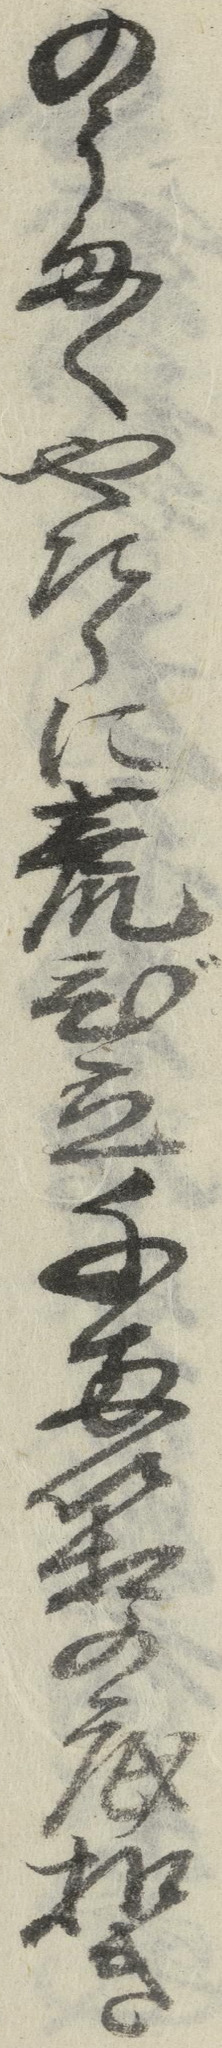のうたくやたらに荒び立千両箱の底扣き
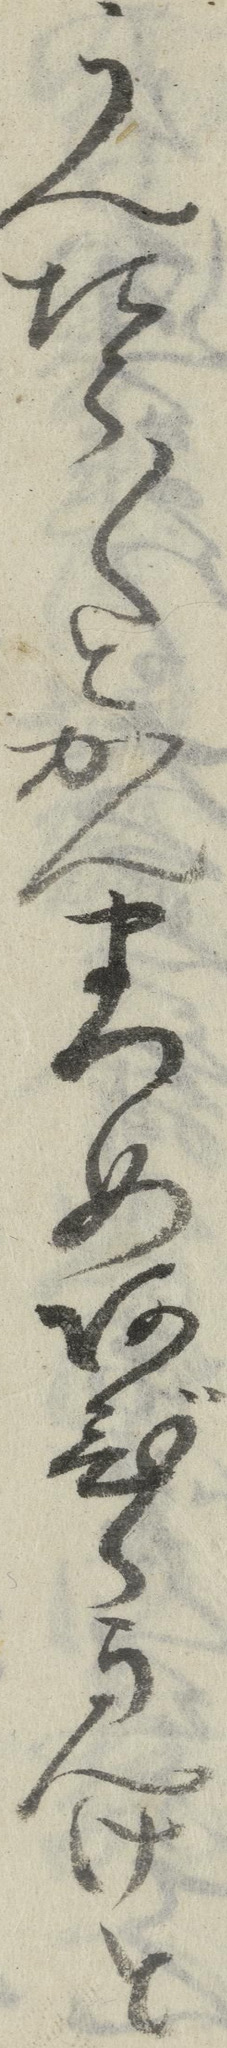うんたら〳〵とかんまつめあびらうんけと
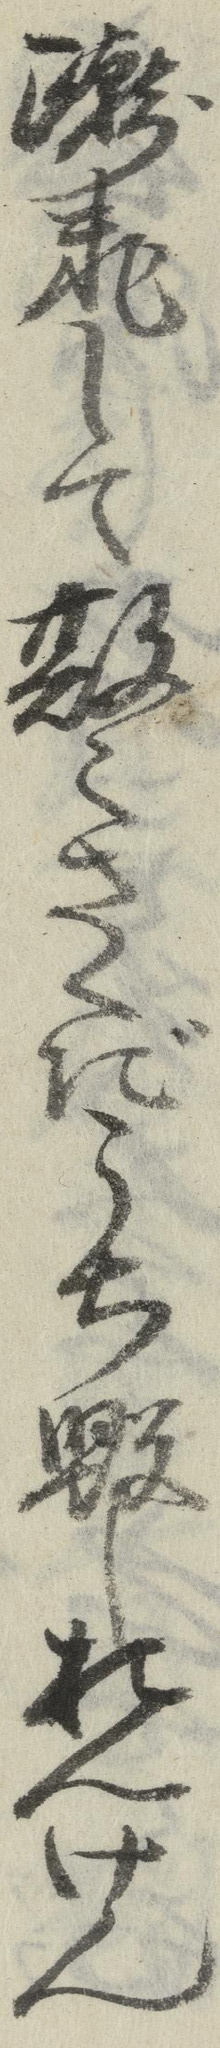蹴飛して散々さくだうち毀しれんけん
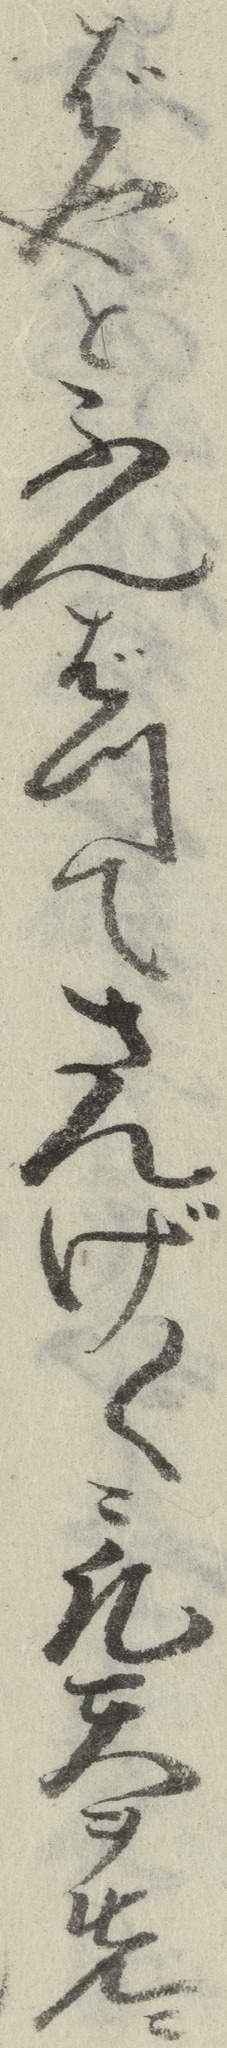ばやとふんばつてさんげ〳〵に凡天を先に
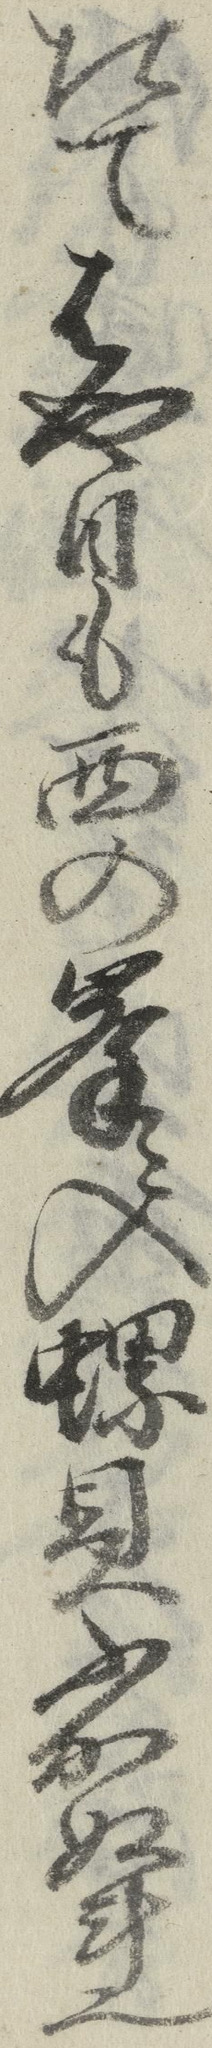たてはや日も西の峯に入螺貝ふかぬ計也
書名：浅間大焼騒動記　中
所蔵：東京大学地震研究所図書室 Earthquake Research Institute Library, The University of Tokyo, JAPAN
